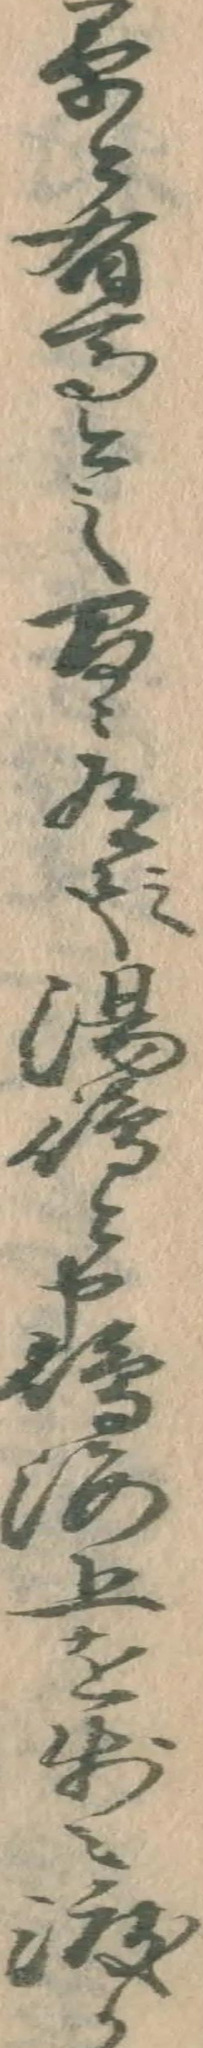草と有馬と之間に有之湯島と申島海上を歩て渡り
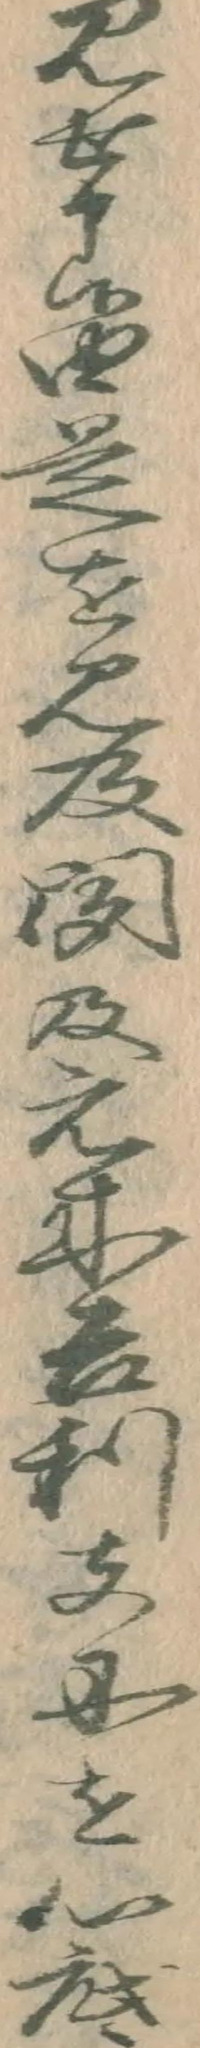見せ申候由是を見及聞及元来吉利支丹を心底
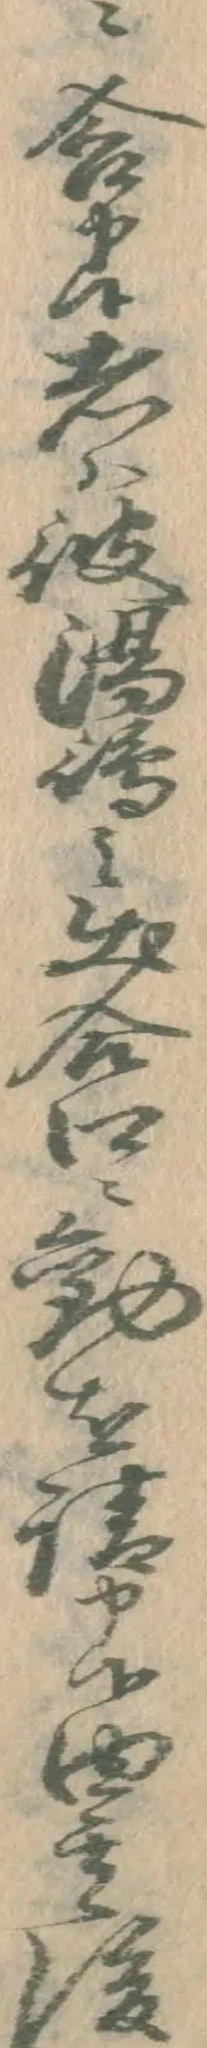に含申候者は彼湯島之出合口に勧を請申候由其後

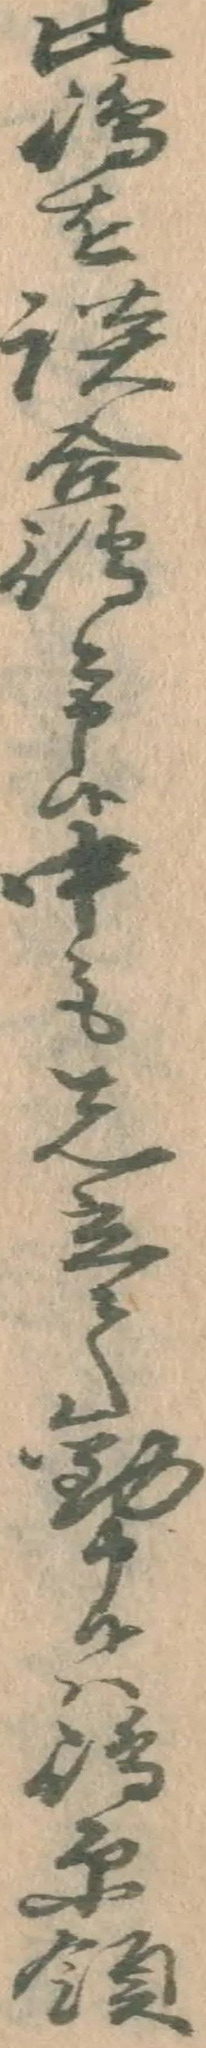此島を談合島と申候中も先立て勧申候は島原領
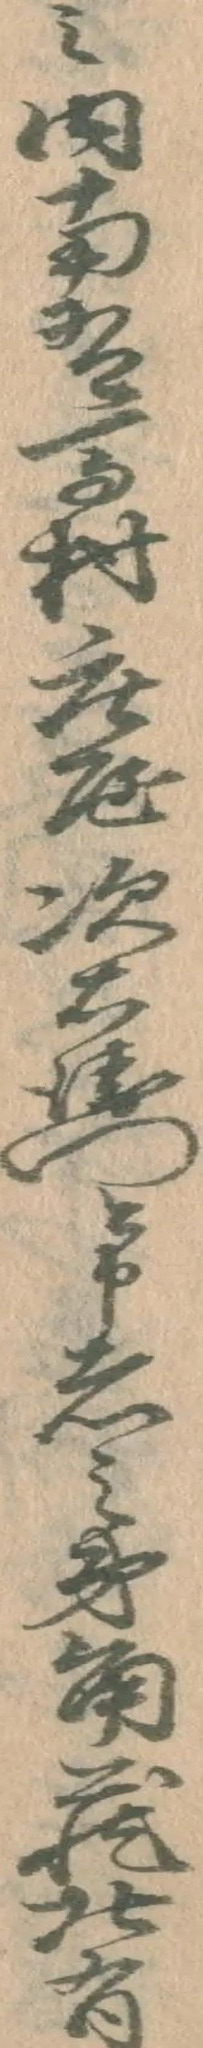之内南有馬村庄屋次右衛門と申者之弟角蔵北有
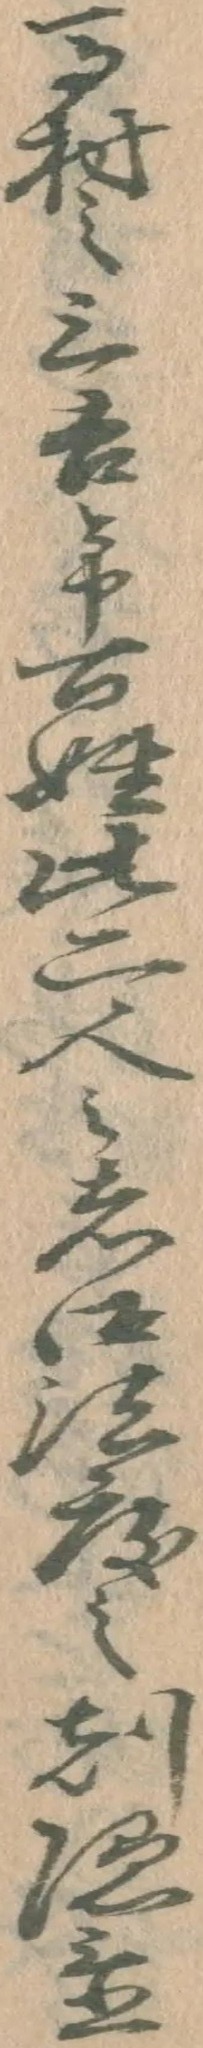馬村之三吉と申百姓此二人之者御法度之刻隠置
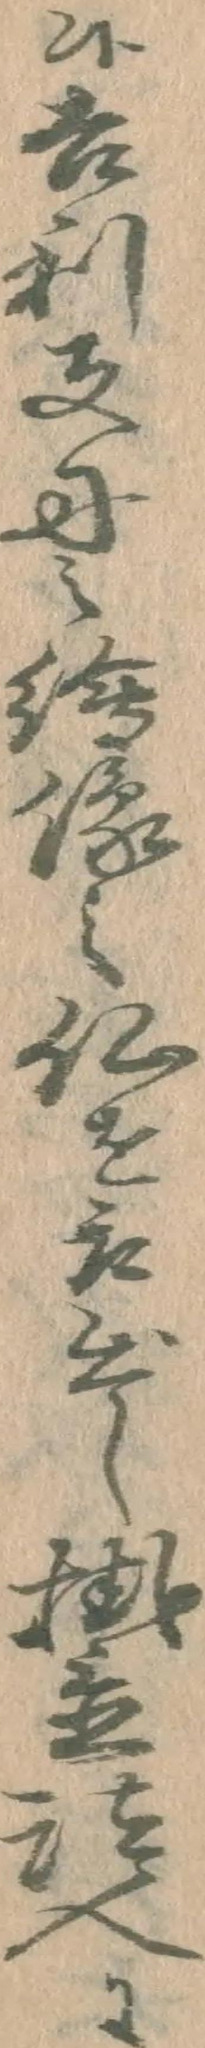候吉利支丹之絵像之仏を取出し掛置諸人に
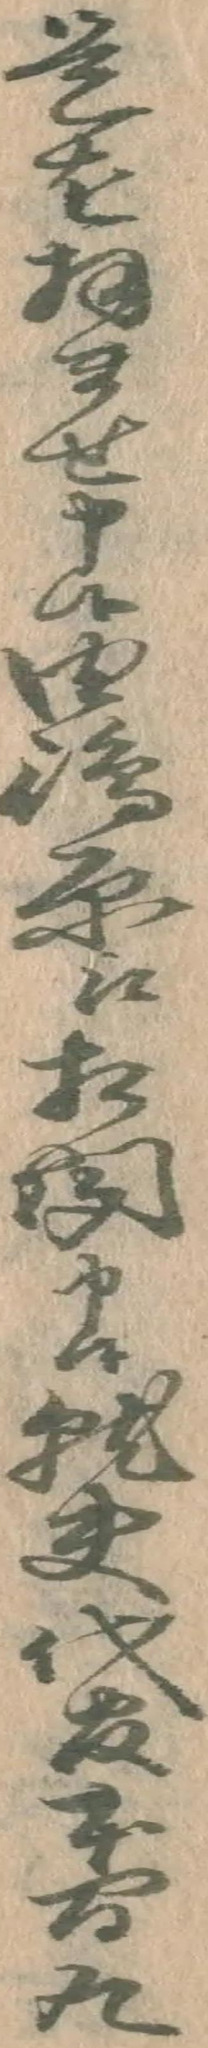是を拝ませ申候由島原え相聞申候就夫代官本間九
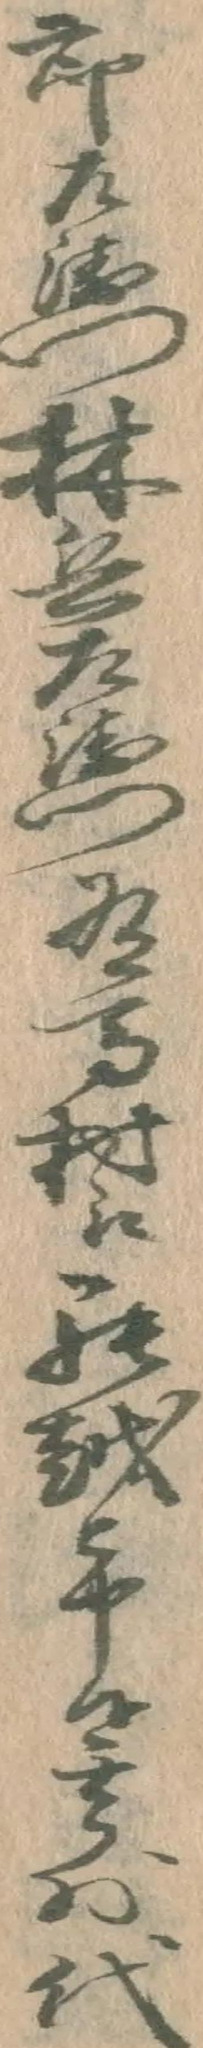郎左衛門林兵左衛門有馬村え罷越被申候其外代
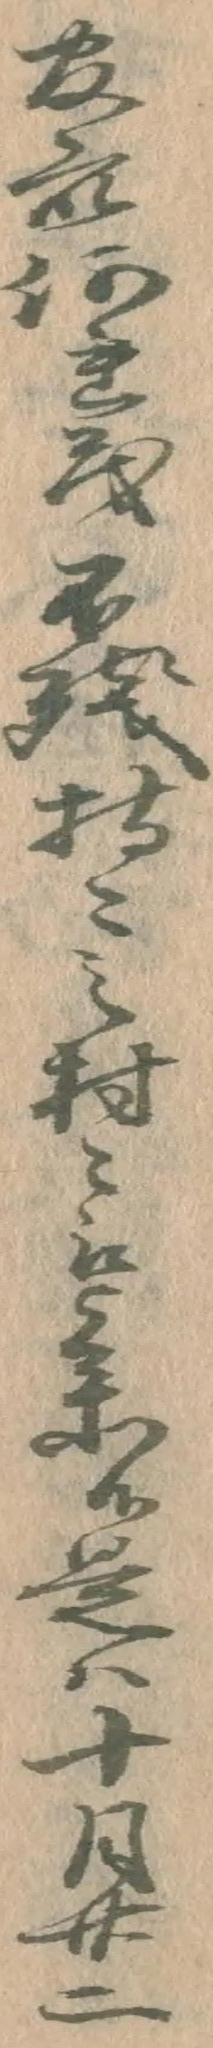官衆何れも不残持々之村々被参候是は十月廿二
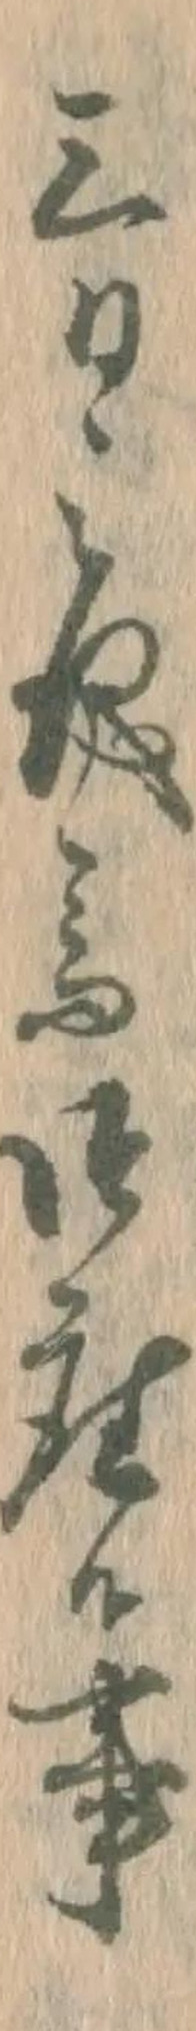三日之儀に而御座候事
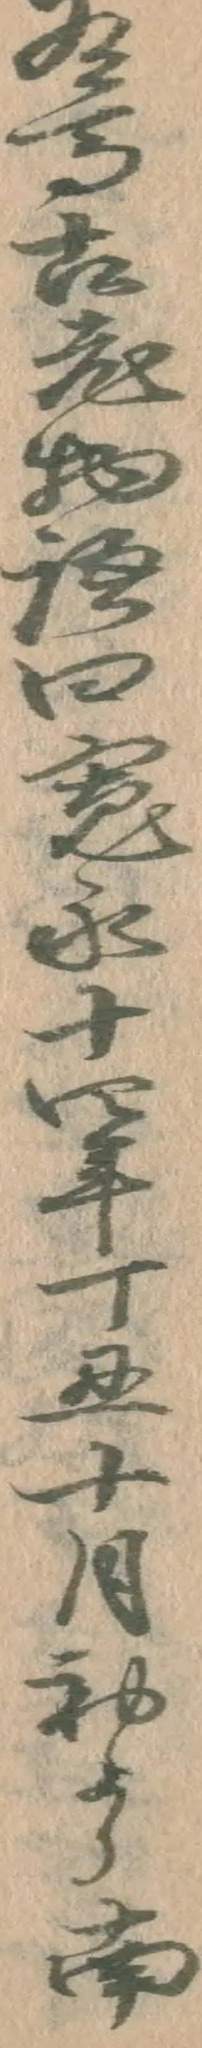有馬古老物語日寛永十四年丁丑十月初より南
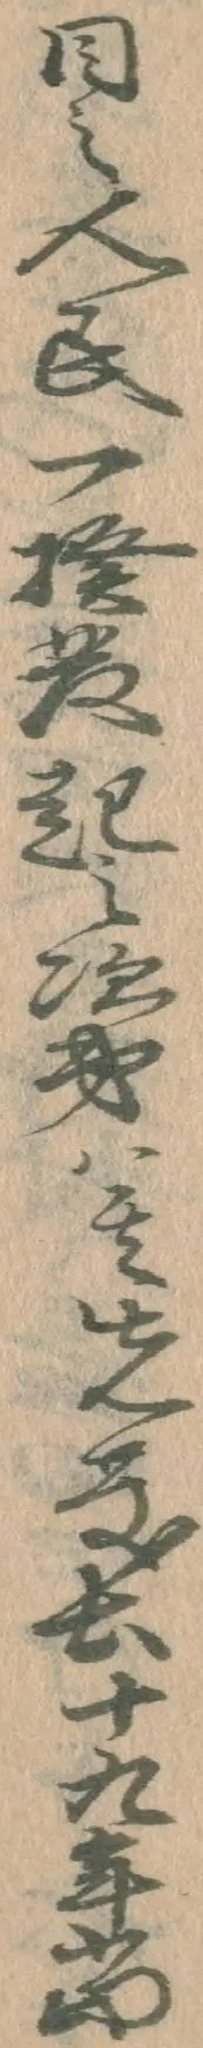目之人民一揆発起之次第は其先慶長十九年当
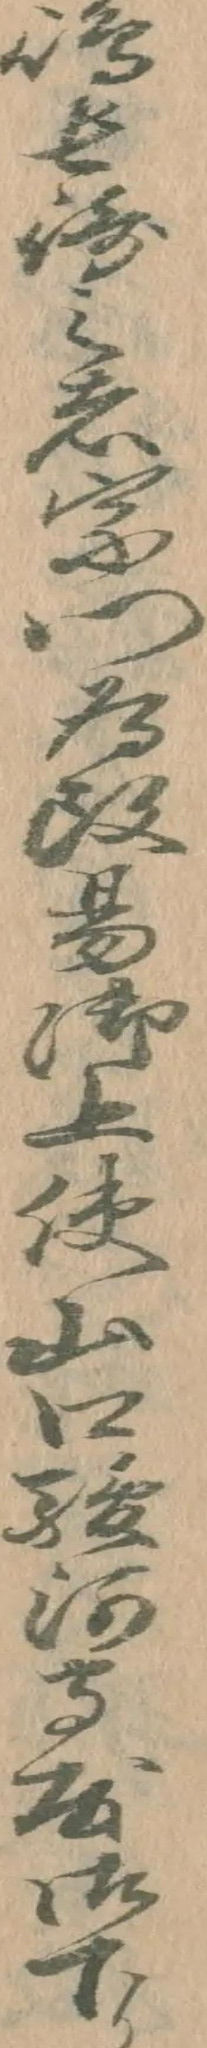島長崎之者宗門為改易御上使山口駿河守殿御下り
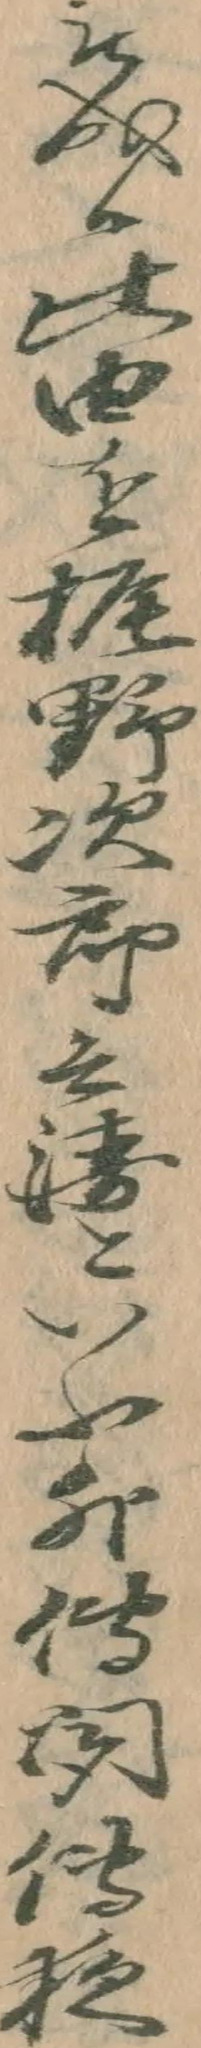被成候此由を梶野次郎兵衛といふ外伝聞伝夜
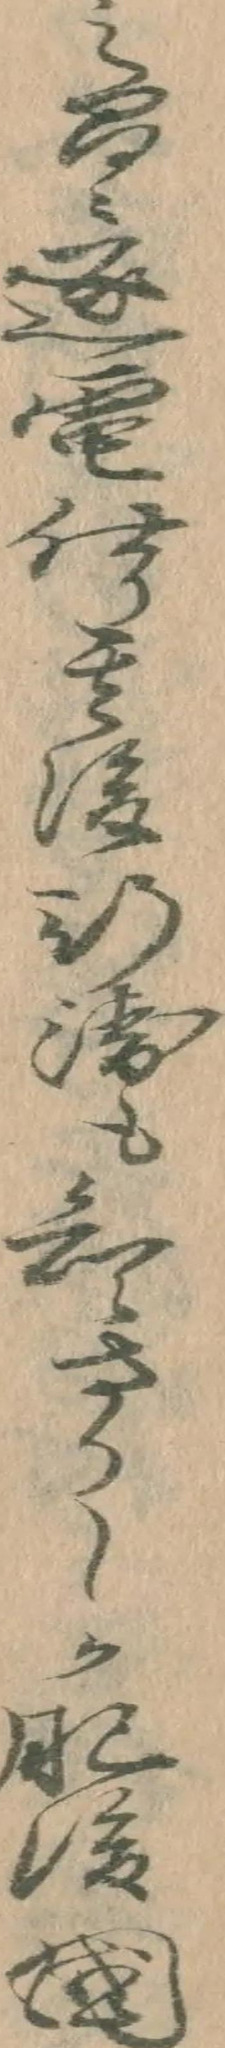之間に逐電仕り其後行衛も知らさりしか肥後国
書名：切支丹御退治記 49巻. [1]
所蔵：国立国会図書館 National Diet Library, JAPAN
